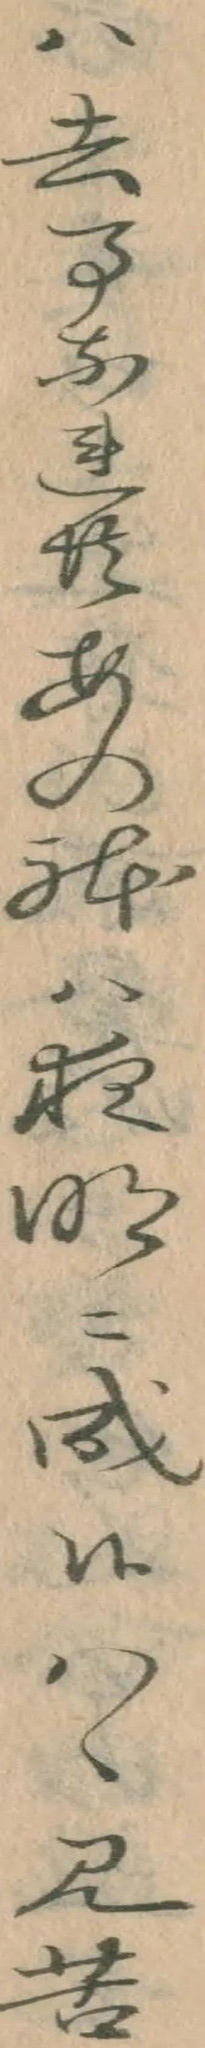は去事な連共あの躰は夜明に成候はゝ見苦
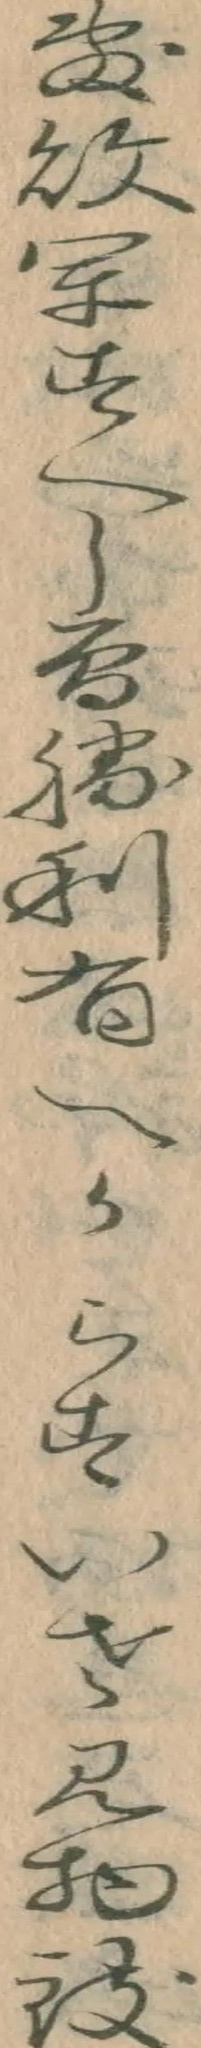敷敗軍春へし曽勝利有へから春いさ見物致
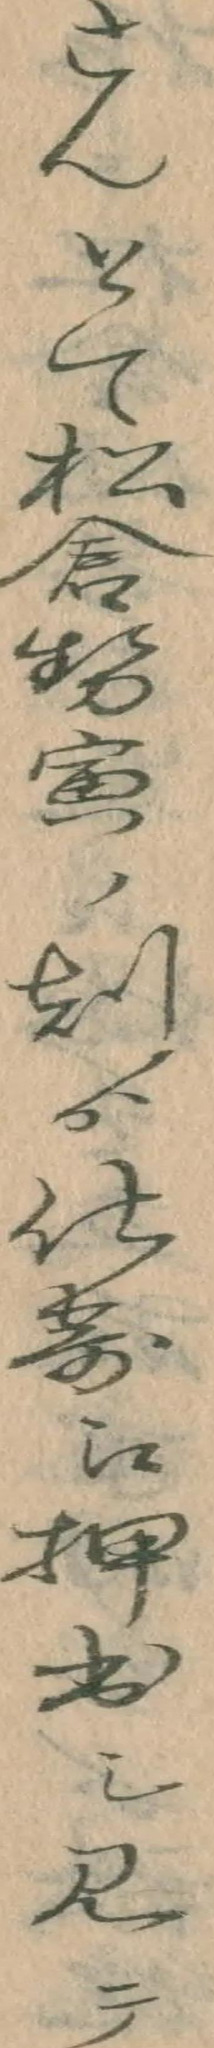さんとて松倉勢寅之刻ゟ仕寄江押出し見て
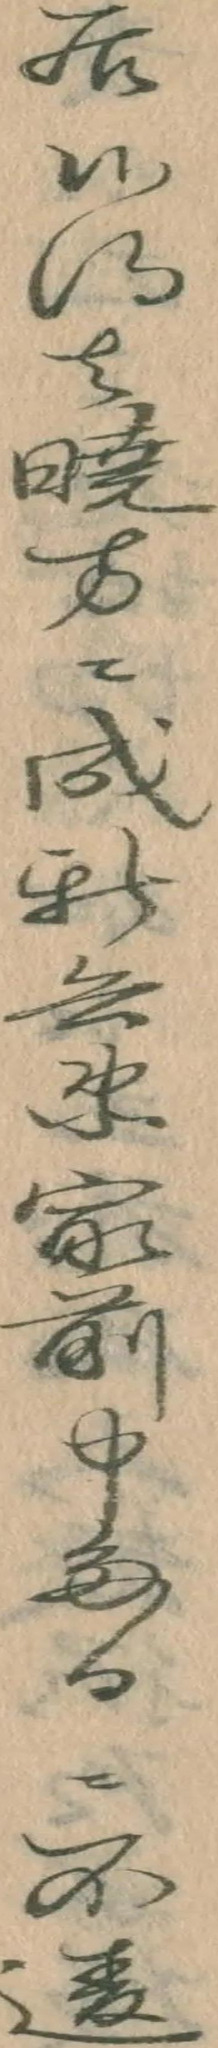居候得者暁方に成新兵衛最前申多るに不違
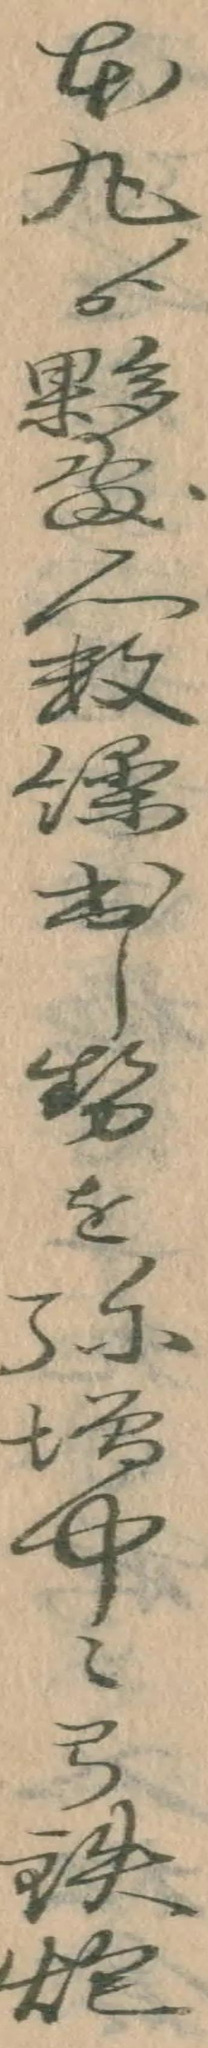本丸ゟ夥敷人数繰出し勢を弥増中之弓鉄炮
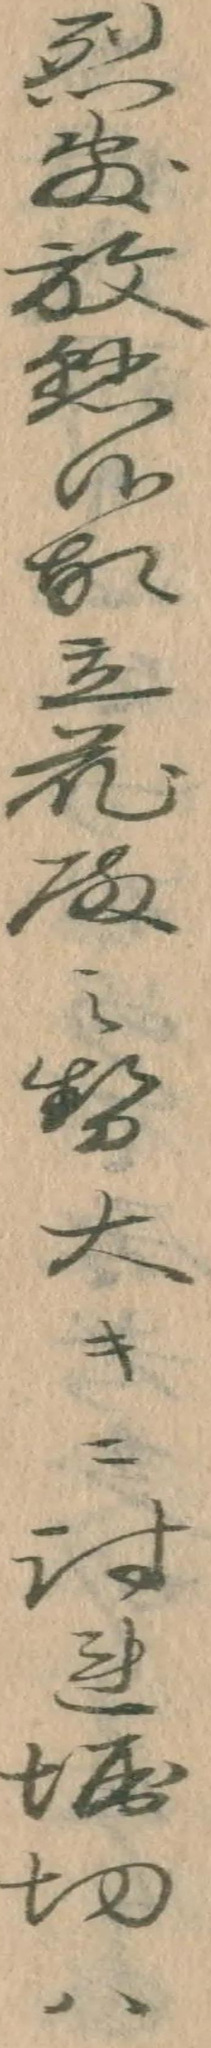烈敷放懸候故立花殿之勢大きに討連堀切は
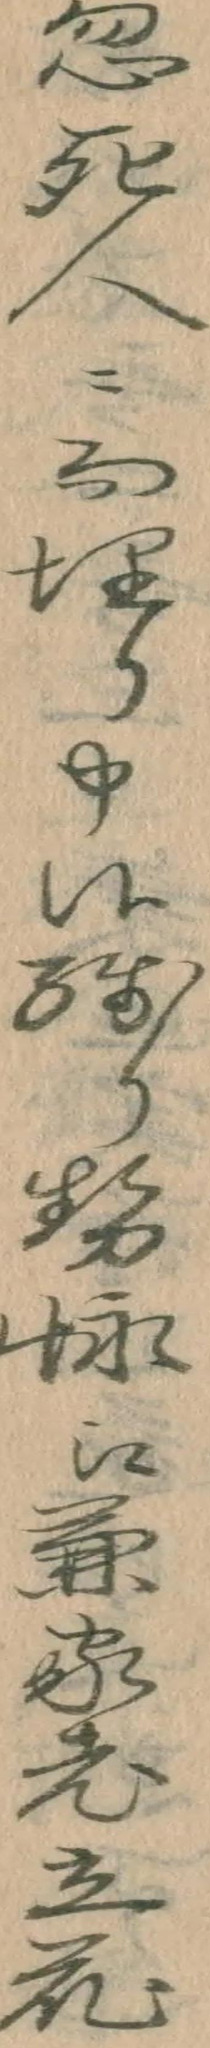忽死人に而埋り申候残り勢怺江兼家老立花
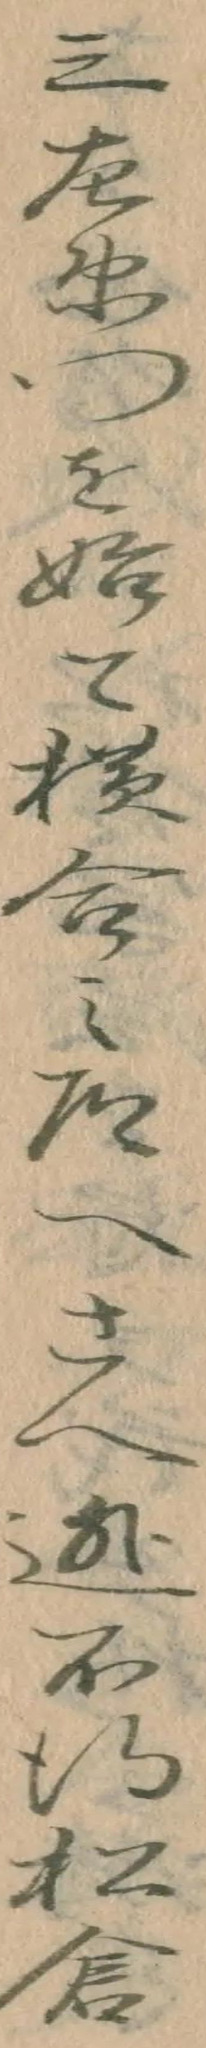三左衛門を始て横合之道へさへ逃不得松倉
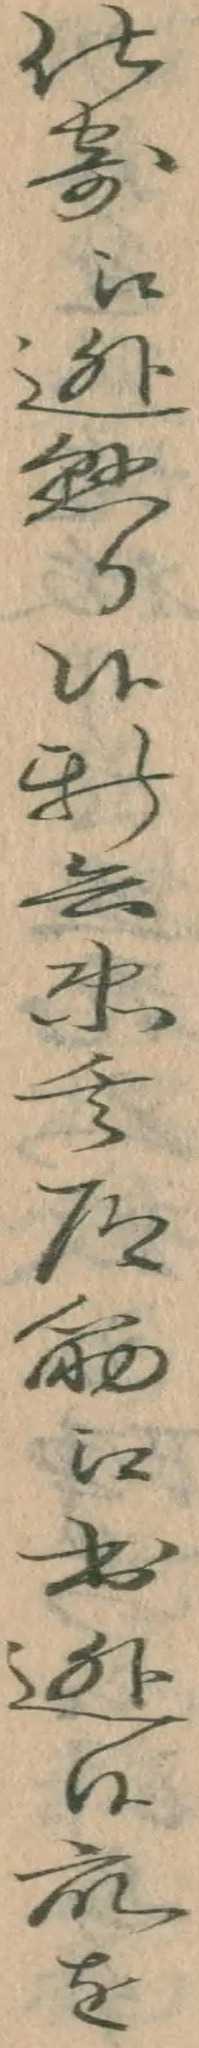仕寄江逃懸り候新兵衛其道筋江出逃候衆を
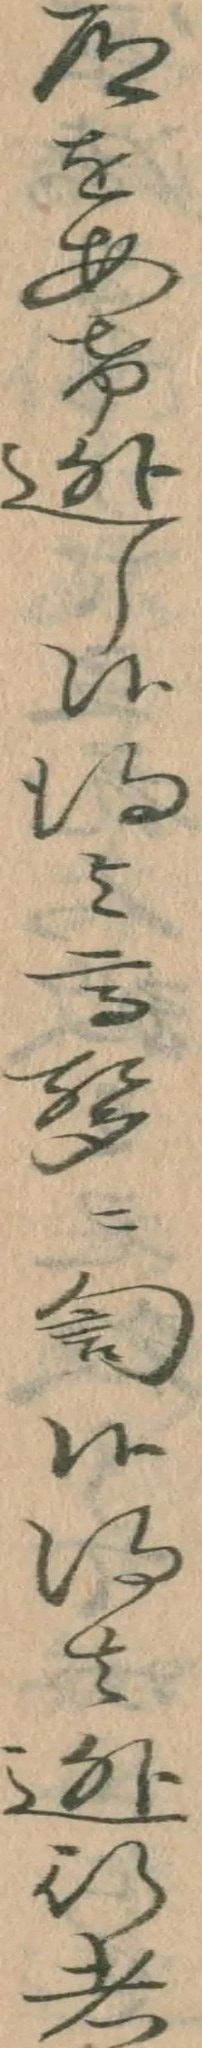道をあ希逃し候得与高声に訇候得者逃行者
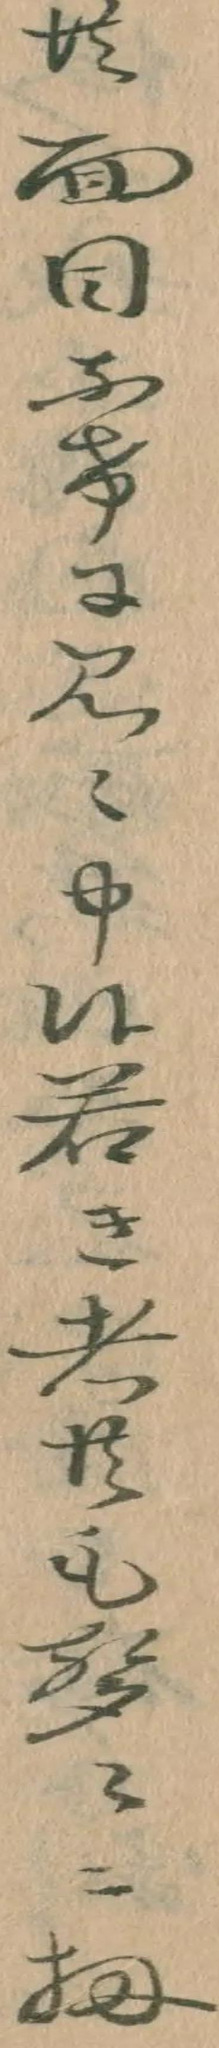共面目な希尓見に申候若き者共も声々に扨
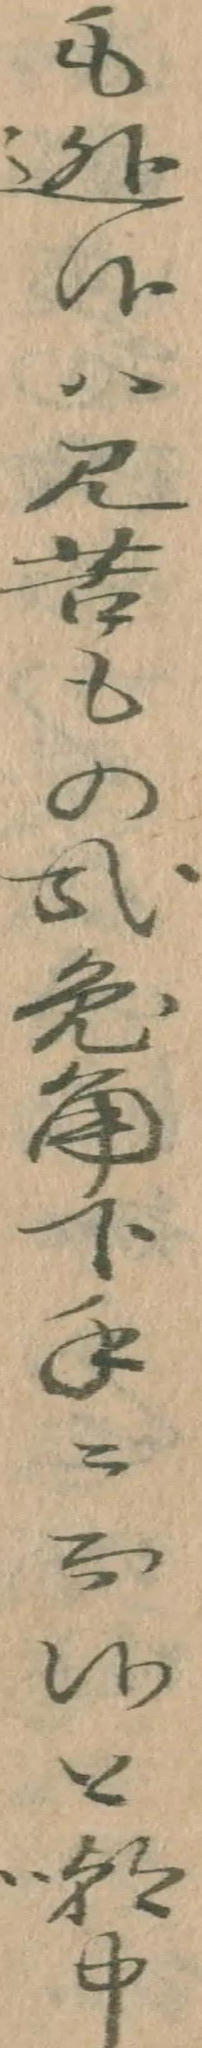も逃候は見苦もの哉兎角下手に而候と嘲申
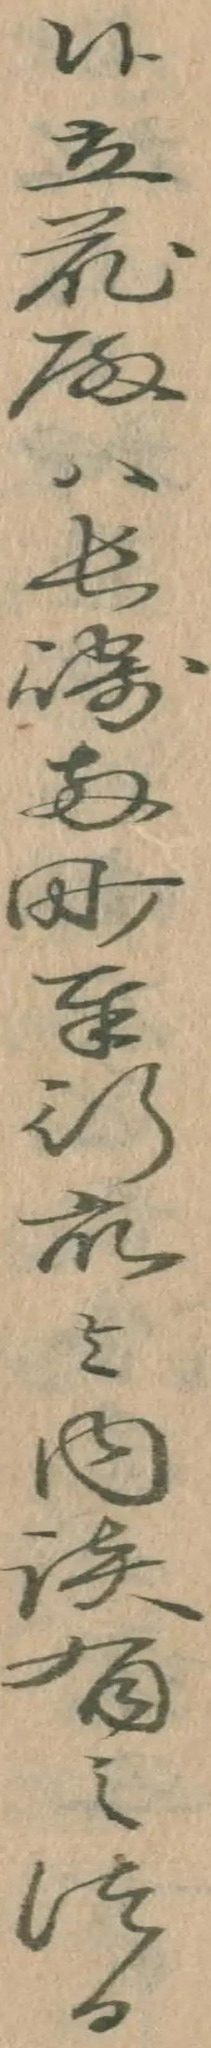候立花殿は長崎両町奉行衆与内談有之徒る
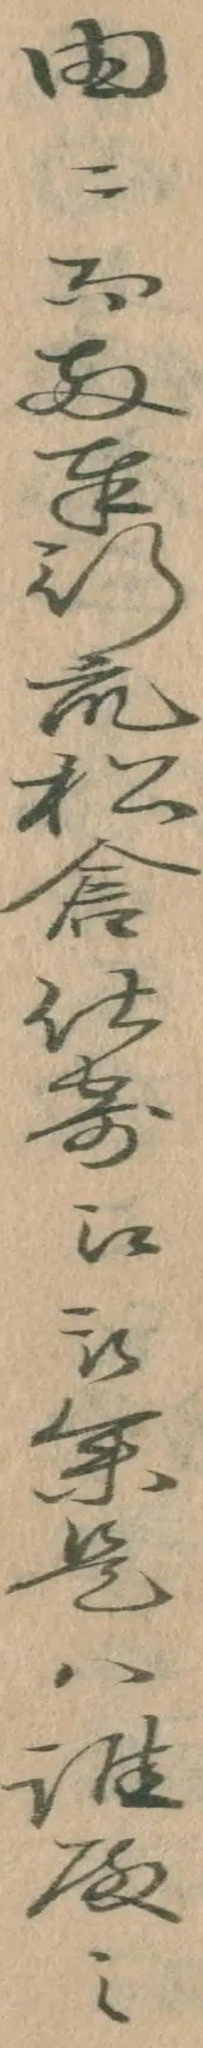由に而両奉行衆松倉仕寄江被参是は誰殿之
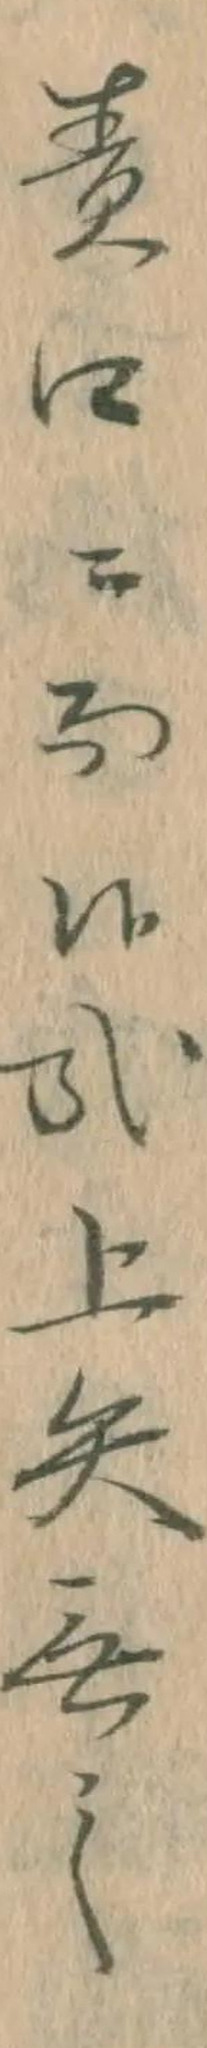責口に而候哉上矢無之
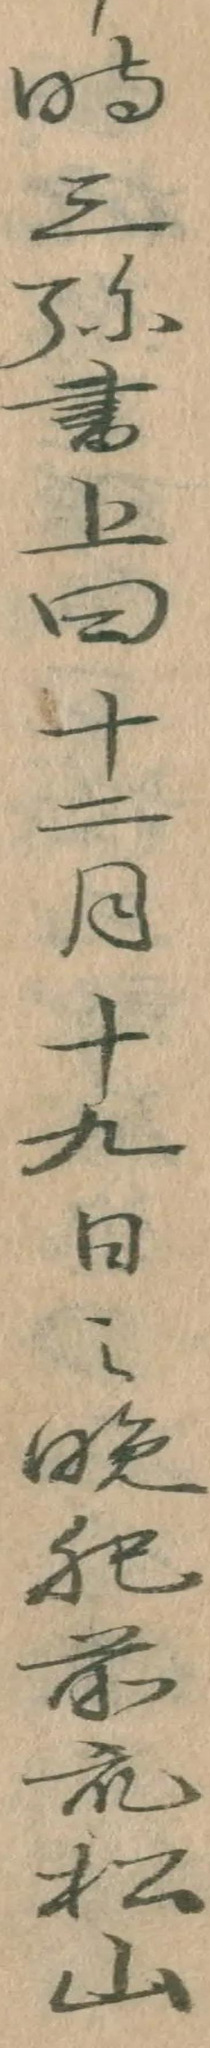十時三弥書上曰十二月十九日之晩肥前衆松山
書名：切支丹御退治記 49巻. [4]
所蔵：国立国会図書館 National Diet Library, JAPAN
